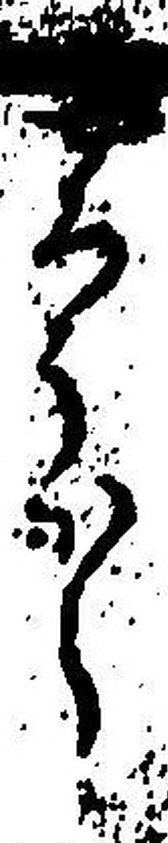やろうから
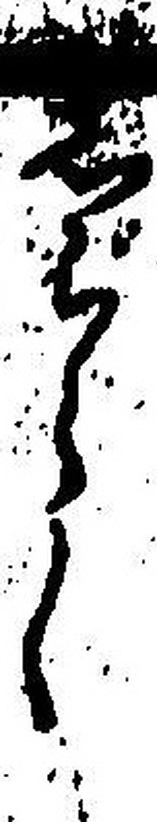しばらく
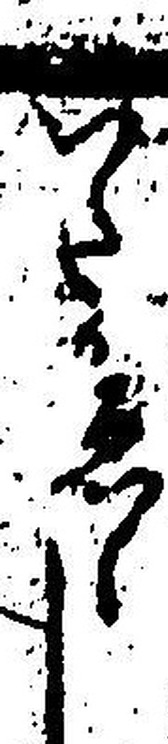いたかゑゝ

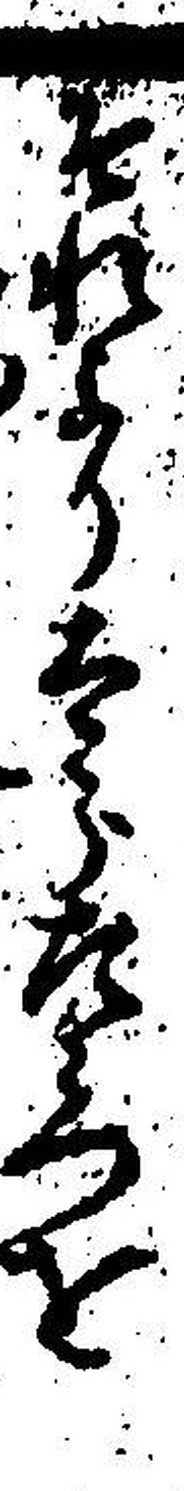それより太郎左衛門を
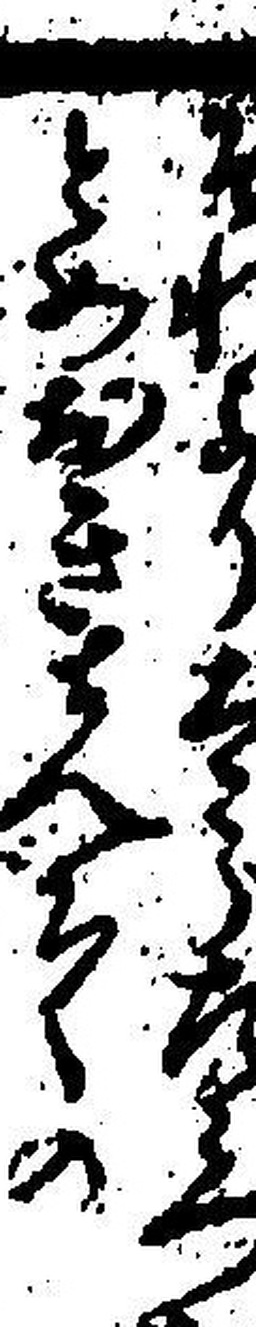とめおきてんちくの
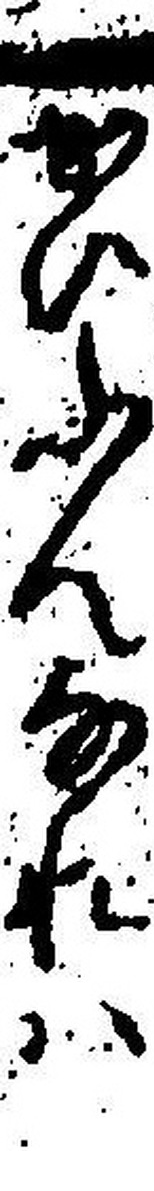かいふんなれは
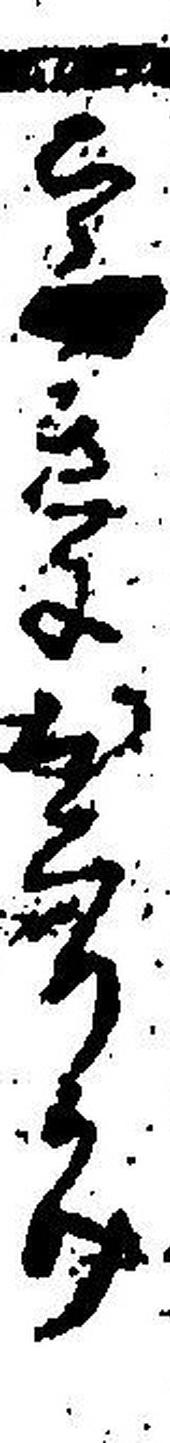こうきにおこりかけ
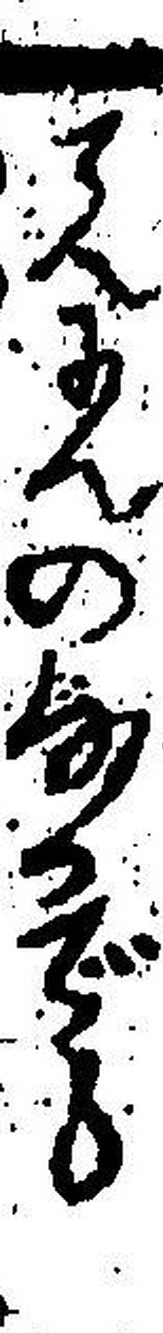てんにんのなかでも
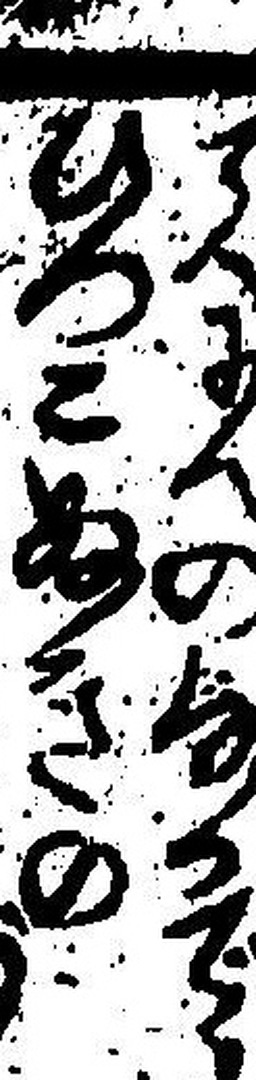ひつこぬきの
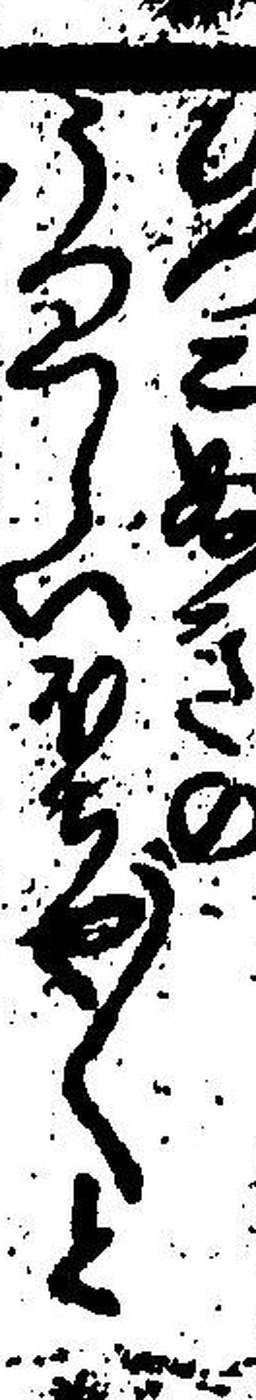うつくしいほちや〳〵と
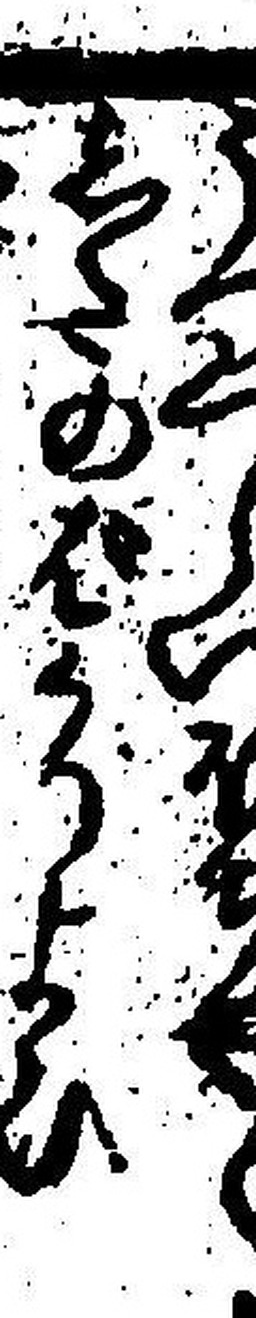したのばかりよひ
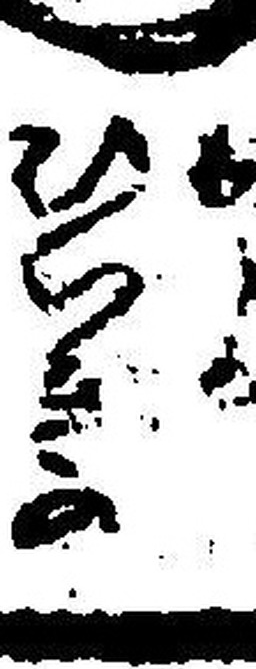ひいきの
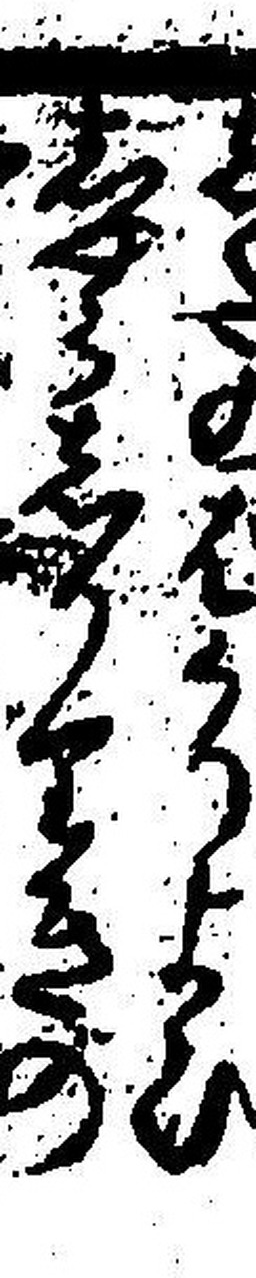しやうしちりきの
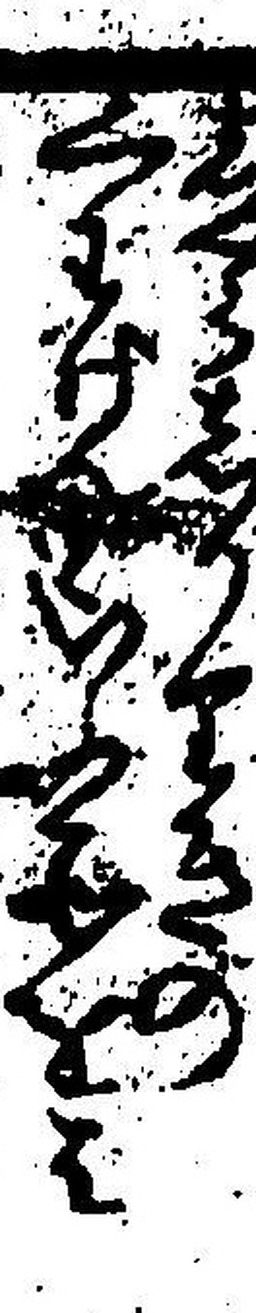くわげんといふ所をは
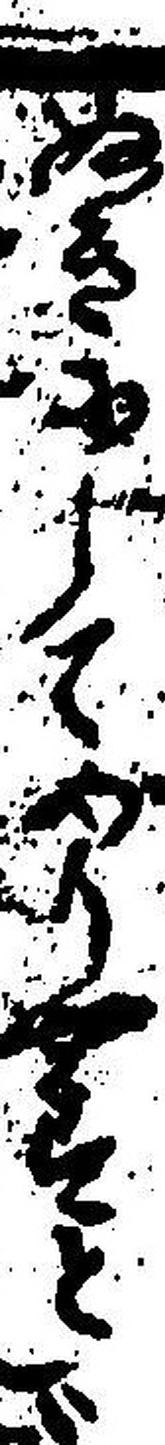ぬきにしてめりやすと
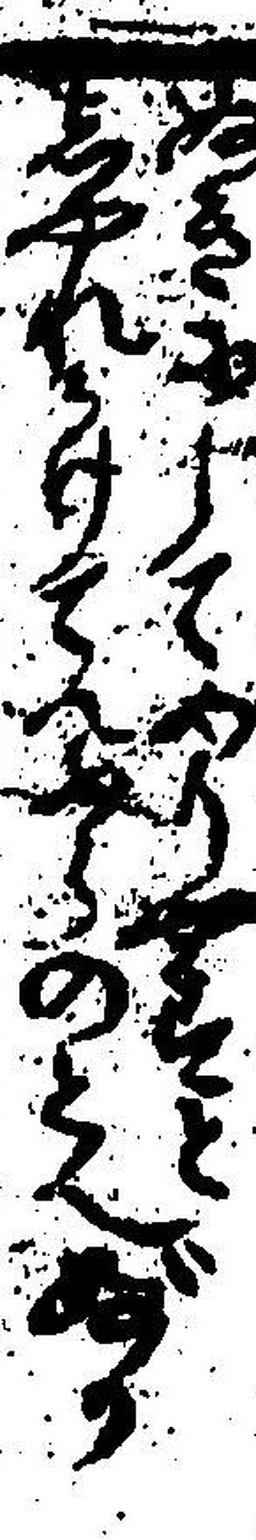しやれかけてんふらのとんぶり
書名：牡丹餅棚有 / 市場通笑作
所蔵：東京大学総合図書館 General Library in the University of Tokyo, JAPAN
